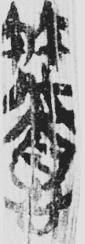○（虘）
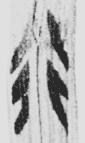行
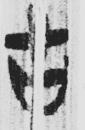古
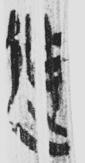{尸拃}
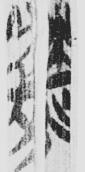癹（發）
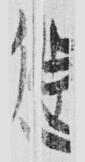{尸拃}
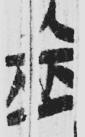者
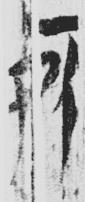死
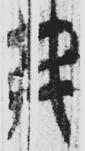弗
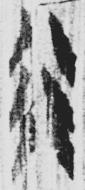行
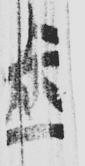者
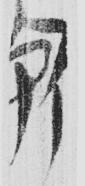死
